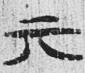亓
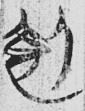○（食）
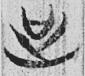足
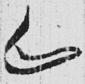㠯
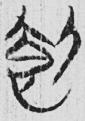○（食）
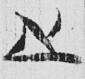之
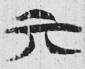亓
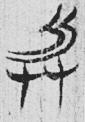兵
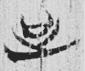足
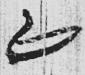㠯
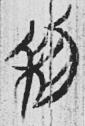利
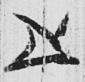之
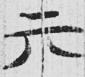亓
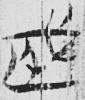城
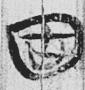固
